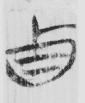貞
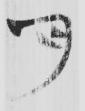月
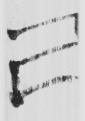己
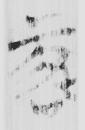{亥口}
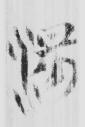湯
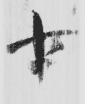才
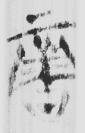啻
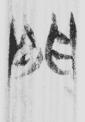門
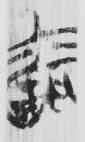{尒䎽}
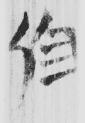於
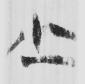少
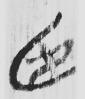臣
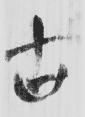古
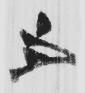之
